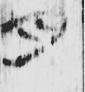月
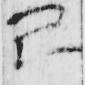己
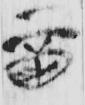酉
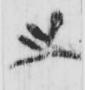之
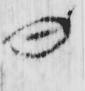日
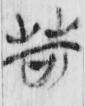苛
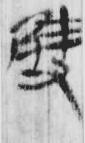雘
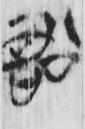訟
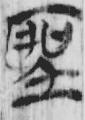聖
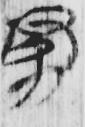蒙
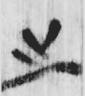之
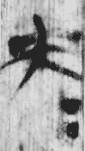大夫
